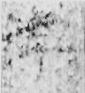東
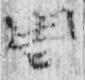周
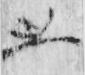之
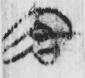客
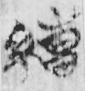○（紳）
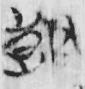朝
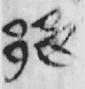○（燕）
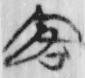客
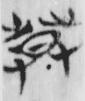登
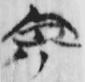余
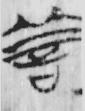善
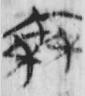秦
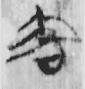客
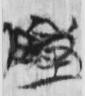○（陳）
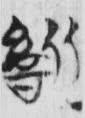慎
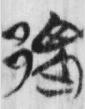○（魏）
